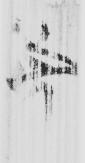先
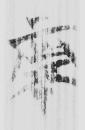帝
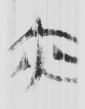亦
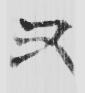又
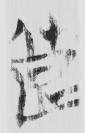良
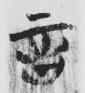言
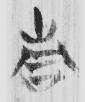青
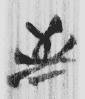至
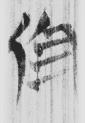於
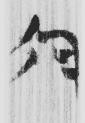今
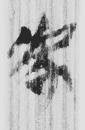虎
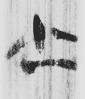少
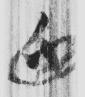臣
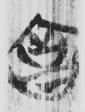合
